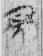○（冠）
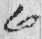㠯（以）
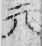亓（其）
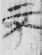不
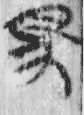○（得）
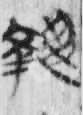執
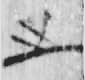之
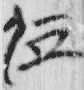凥
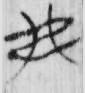弗
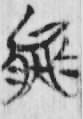能
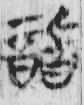詣
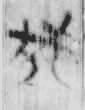癸
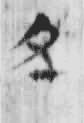丑
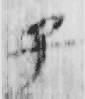子
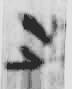之
